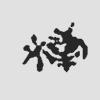{木㫃杲}
